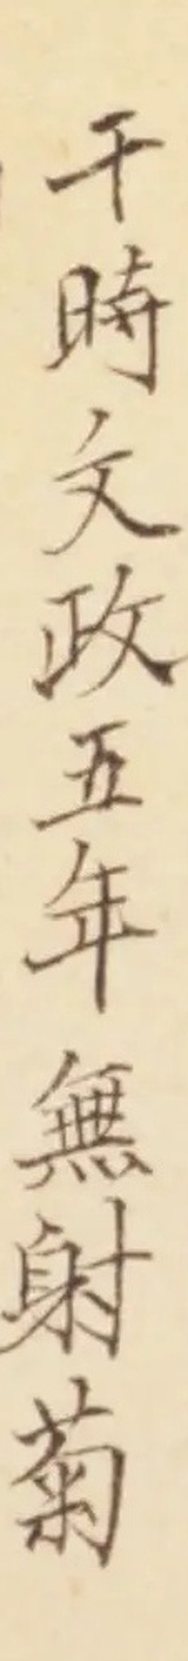于時文政五年無射菊
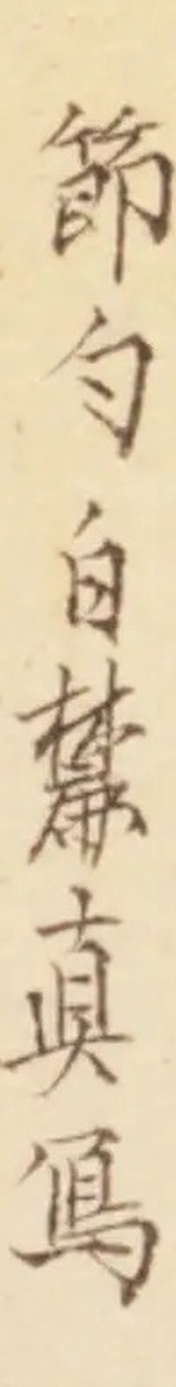節句白麓真写
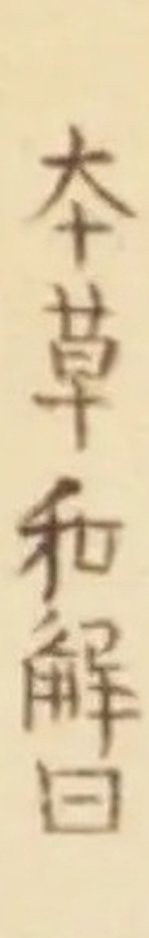本草和解曰
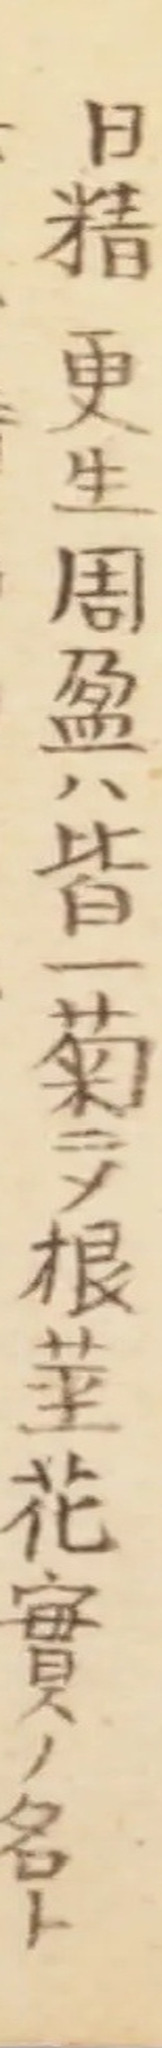日精更生周盈ハ皆一菊ニシテ根茎花実ノ名ト
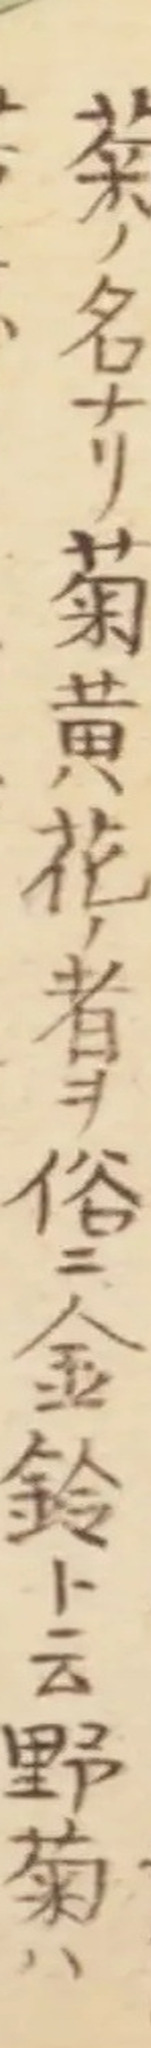菊ノ名ナリ菊黄花ノ者ヲ俗ニ金鈴ト云野菊ハ
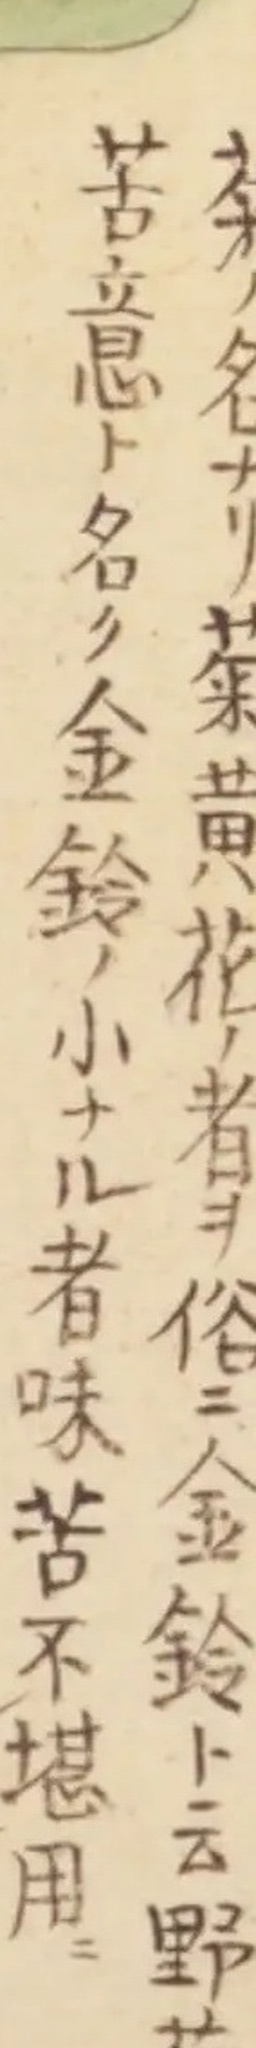苦意ト名ク金鈴ノ小ナル者味苦不堪用

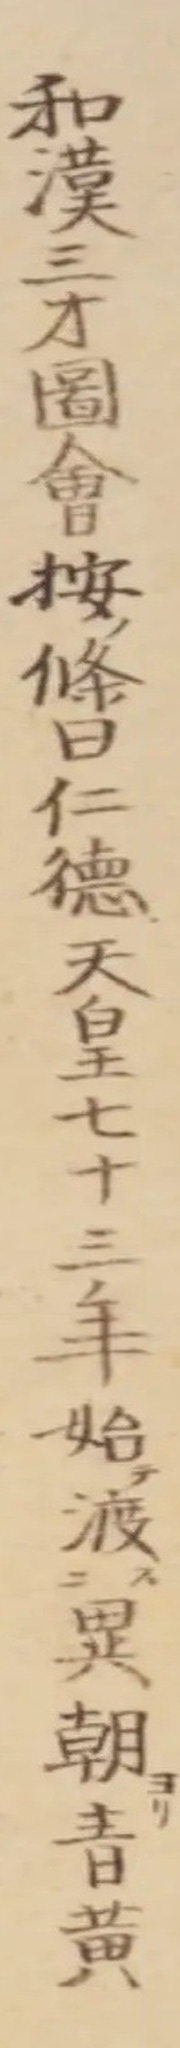和漢三才図会按条曰仁徳天皇七十三年始渡異朝青黄
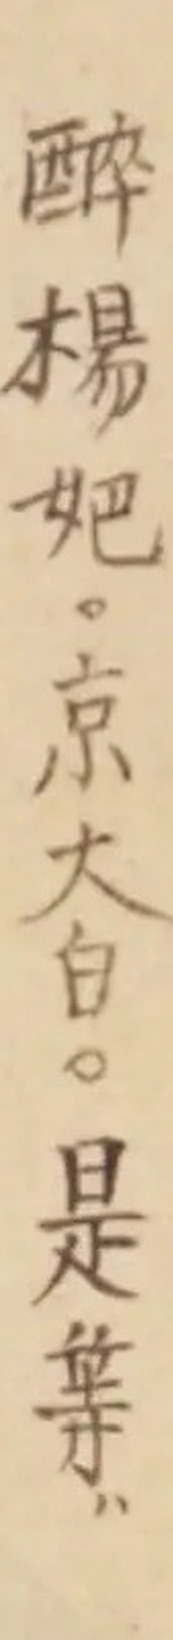酔楊妑◦京大白◦是等
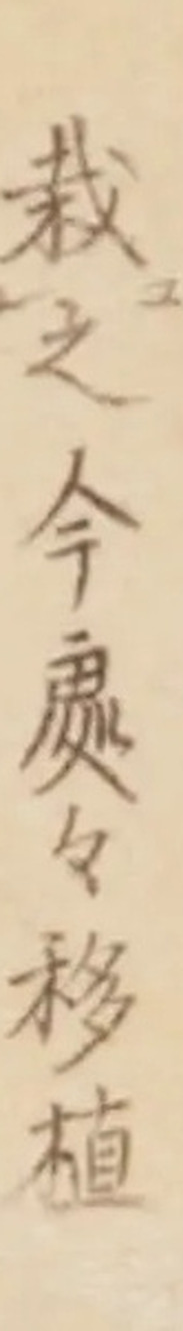栽之今処々移植
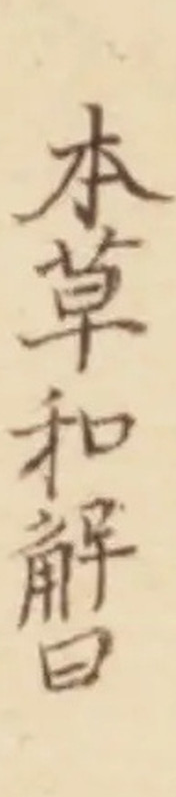本草和解曰
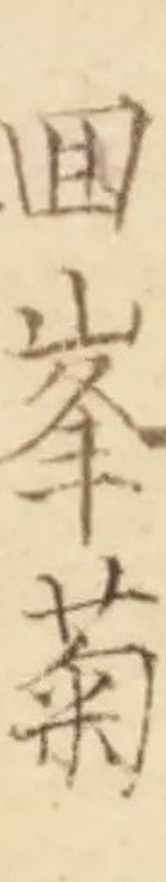回峯菊
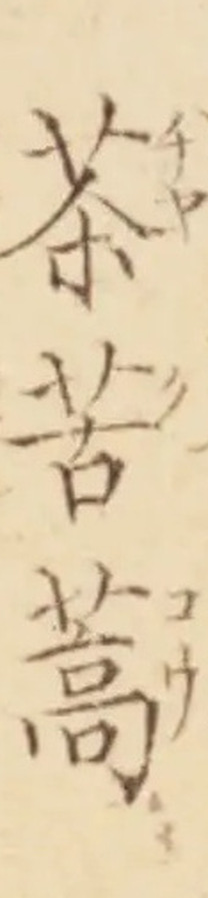茶苦蒿
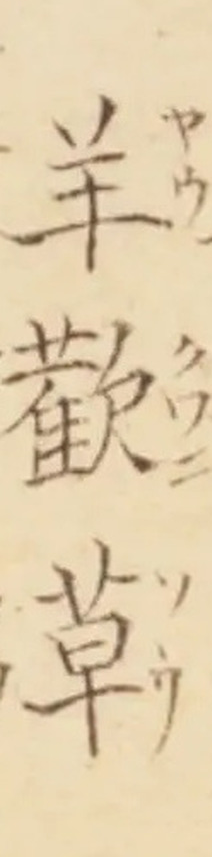羊歓草
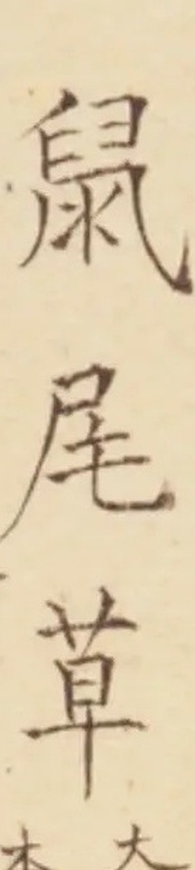鼠尾草
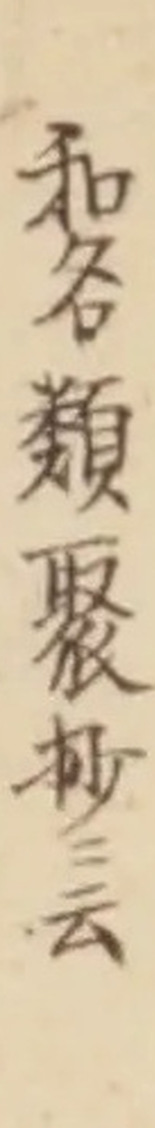和名類聚抄云
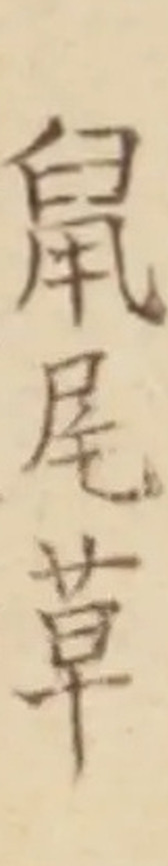鼠尾草
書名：梅園草木花譜秋之部. 1
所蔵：国立国会図書館 National Diet Library, JAPAN
